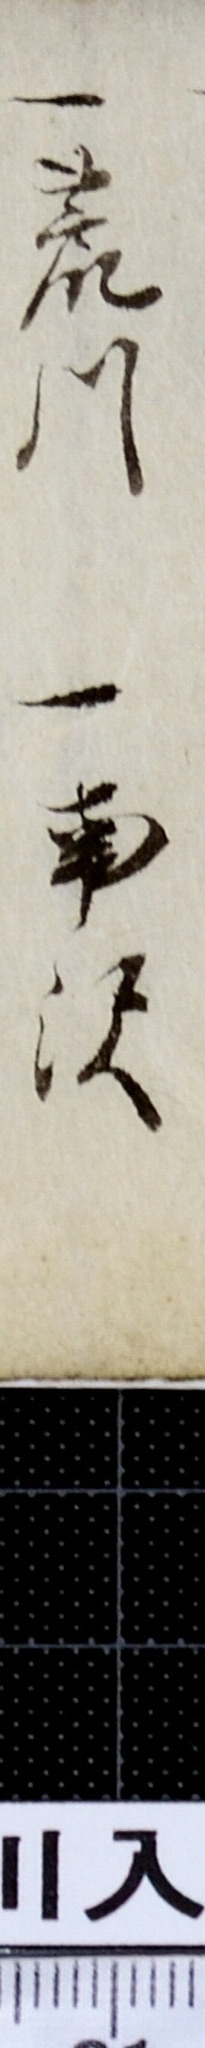一荒川一南沢
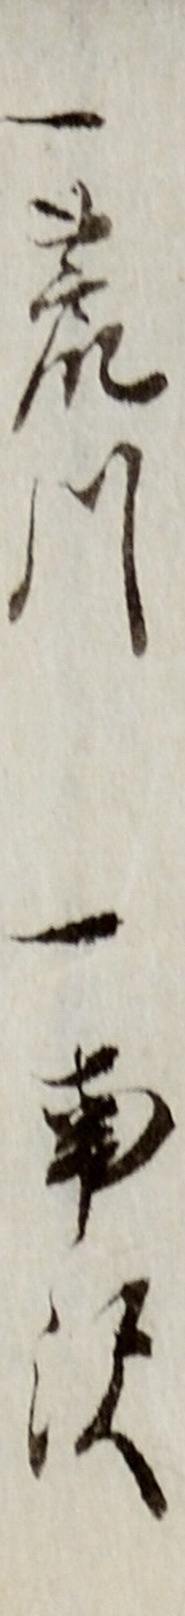一荒川一南沢
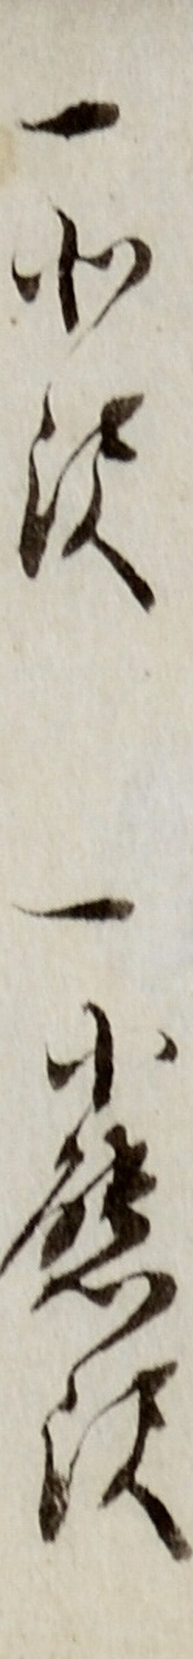一北沢一小熊沢
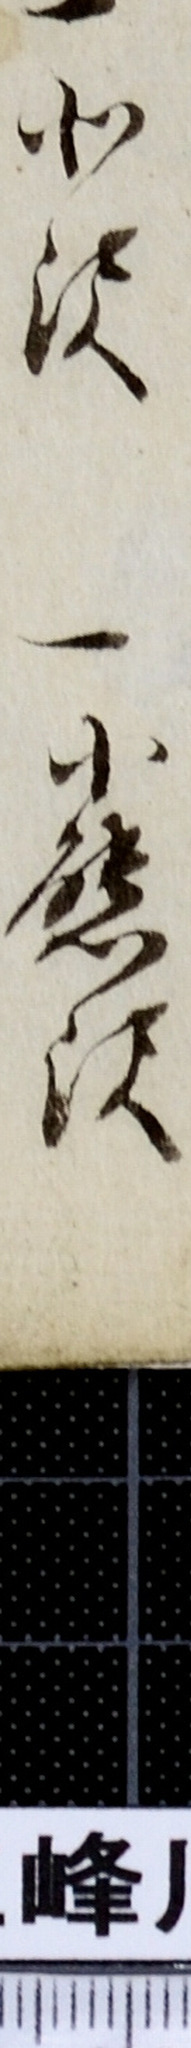一北沢一小熊沢
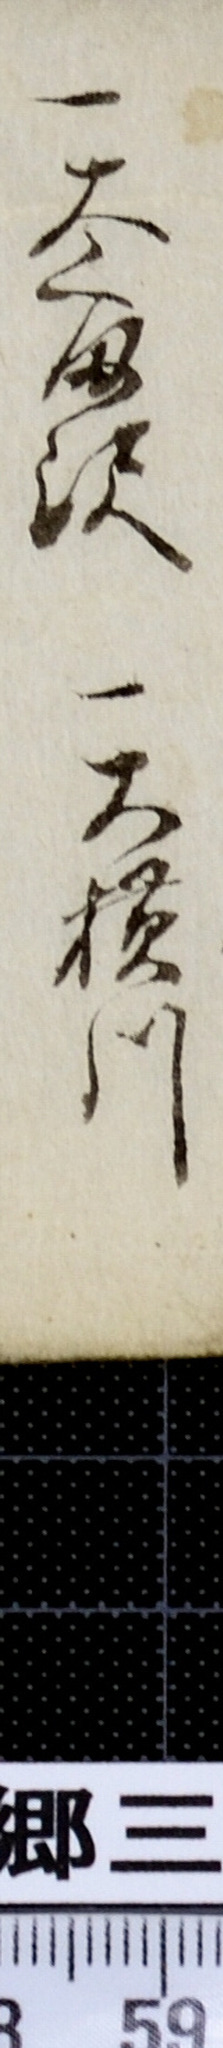一大くま沢一大横川
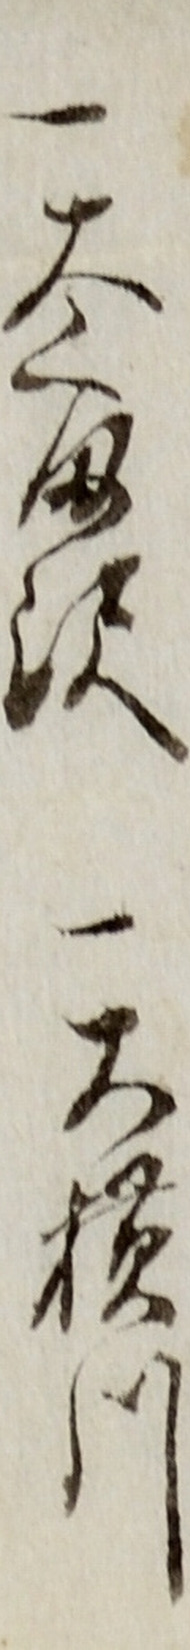一大くま沢一大横川
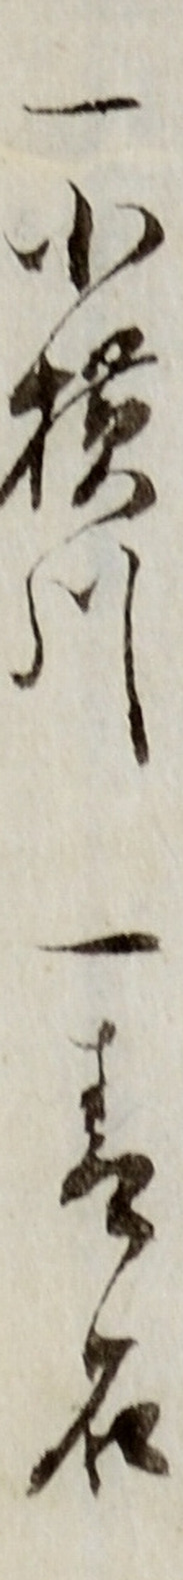一小横川一青名
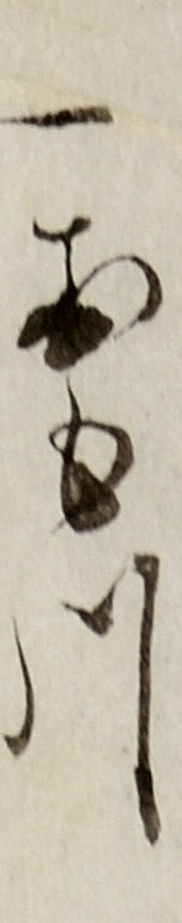一おも川
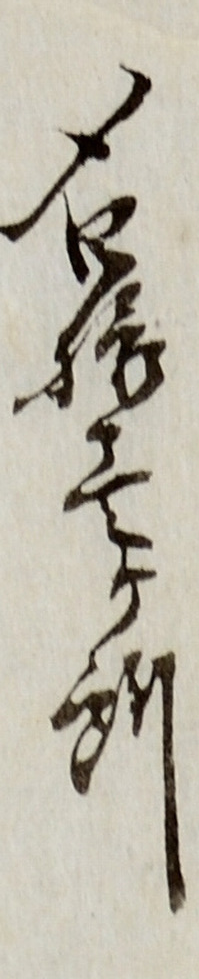〆四拾壱ケ所
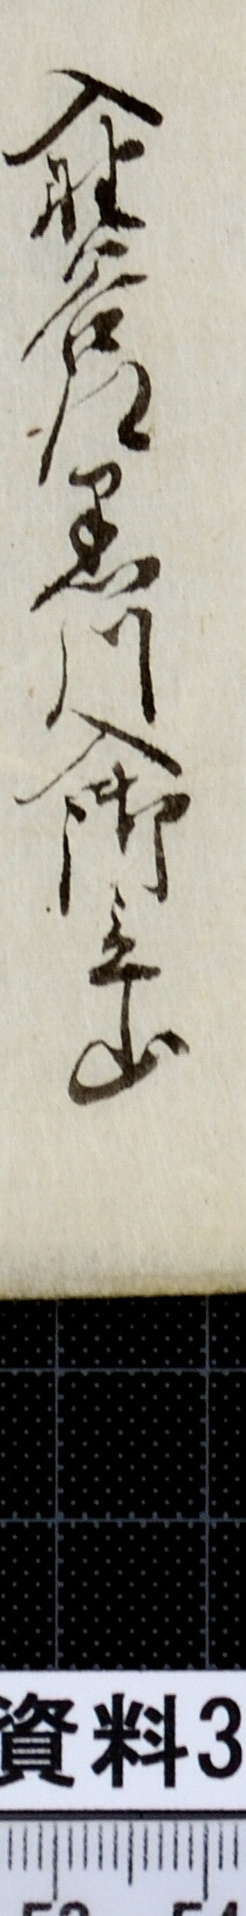入野谷郷黒川入御立山
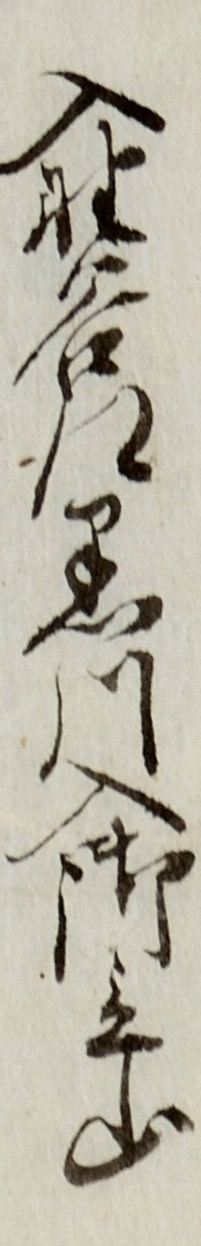入野谷郷黒川入御立山
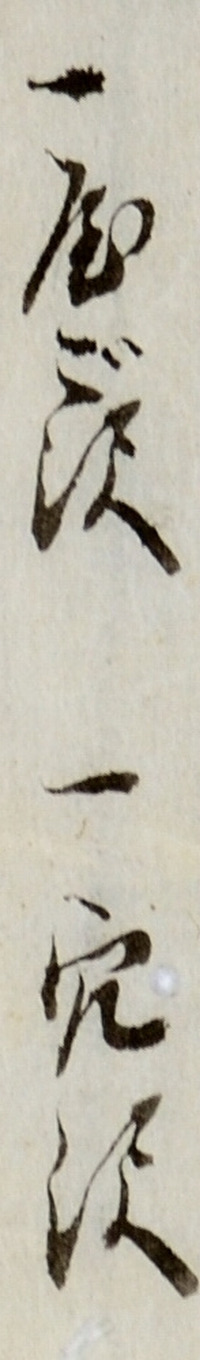一屋ご沢一穴沢
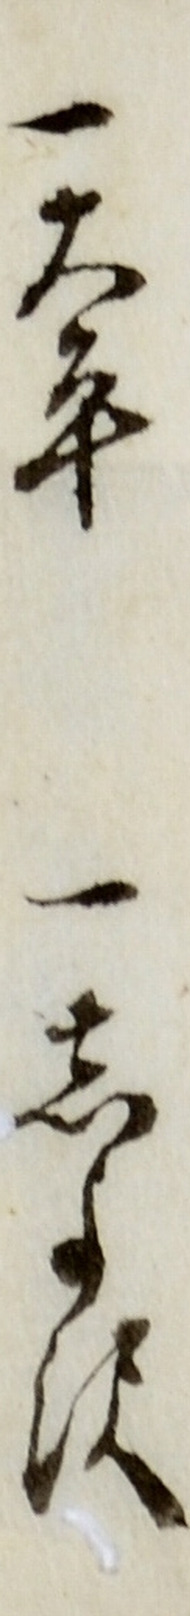一大平一しよ沢
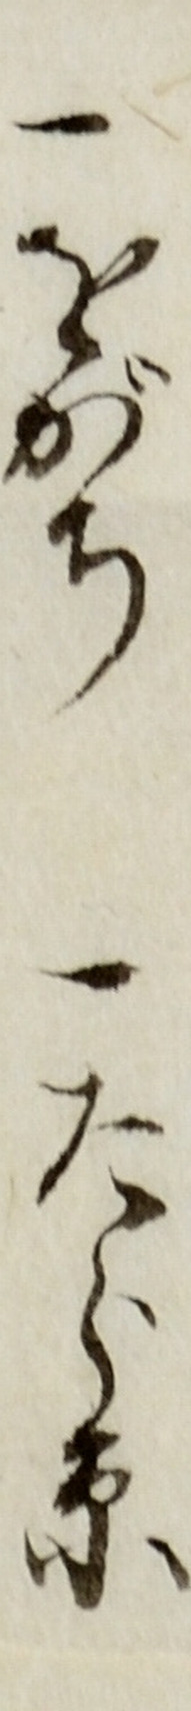一をがち一たら原
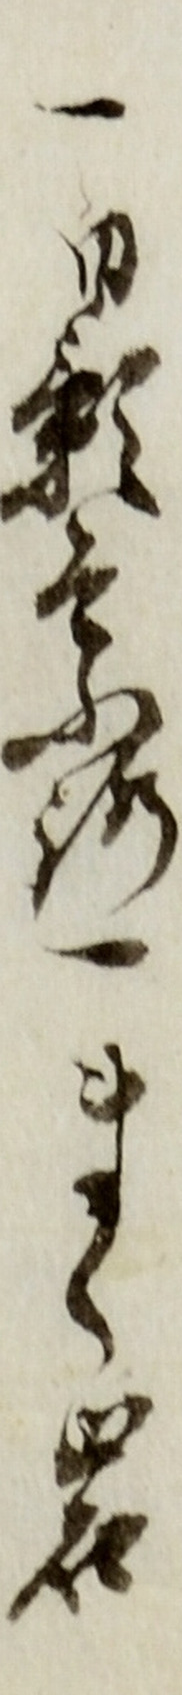一日影そふろ一まゝ岩
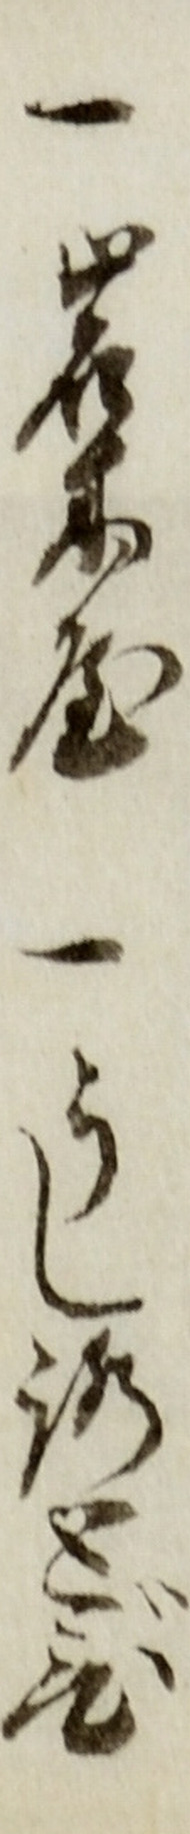一岩木屋一うしろとび
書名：入野谷郷三峯川入御立山名所
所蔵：伊那市立高遠町図書館・合同会社AMANE
